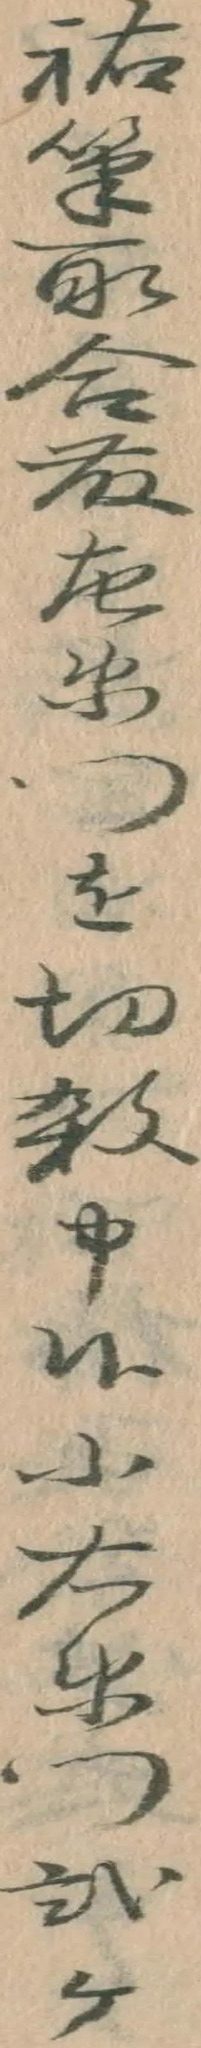祐筆取合藤右衛門を切殺申候小右衛門弐け
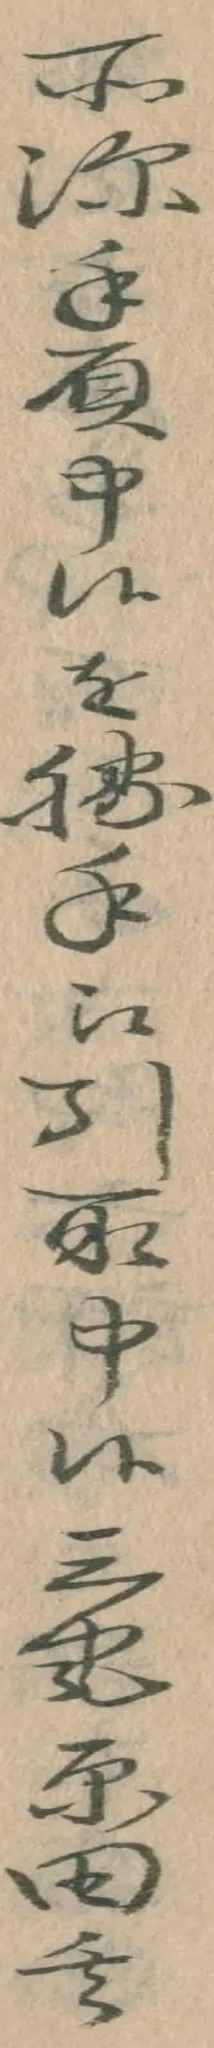所深手負申候を勝手江引取申候三宅原田其
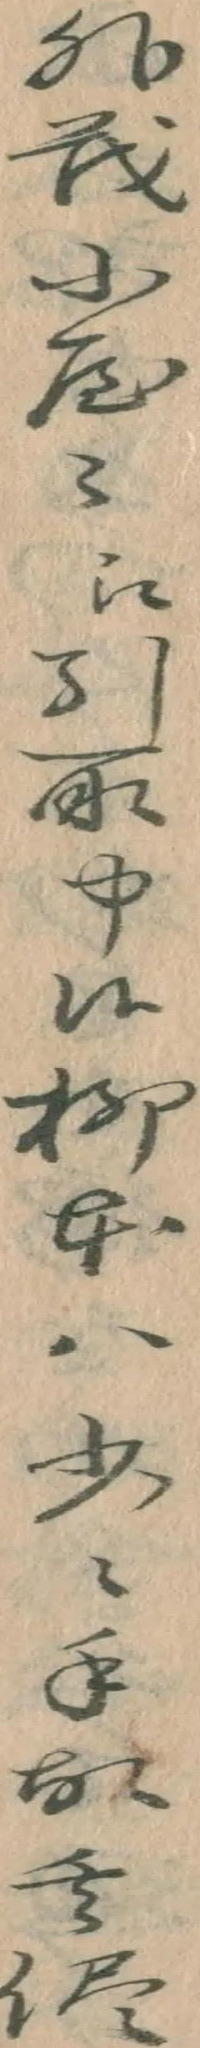外茂小屋々江引取申候柳本は少々手故其侭
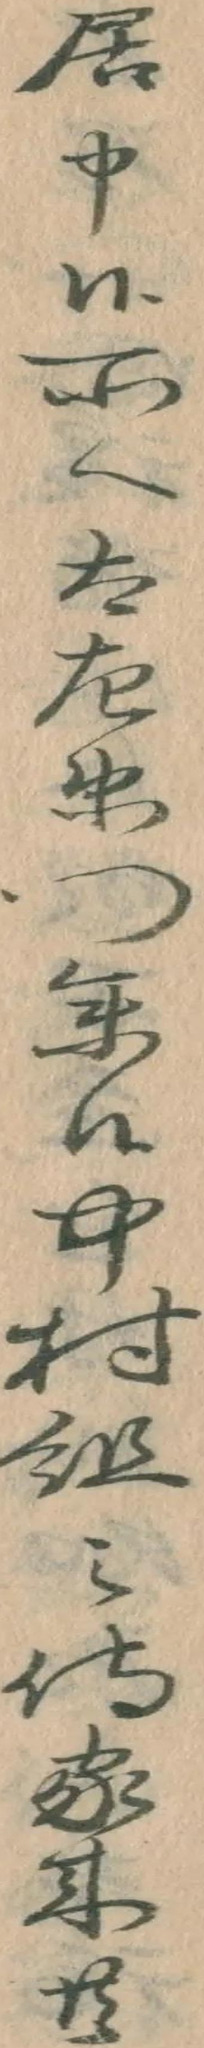居申候所へ太左衛門参候中村組之侍家来共
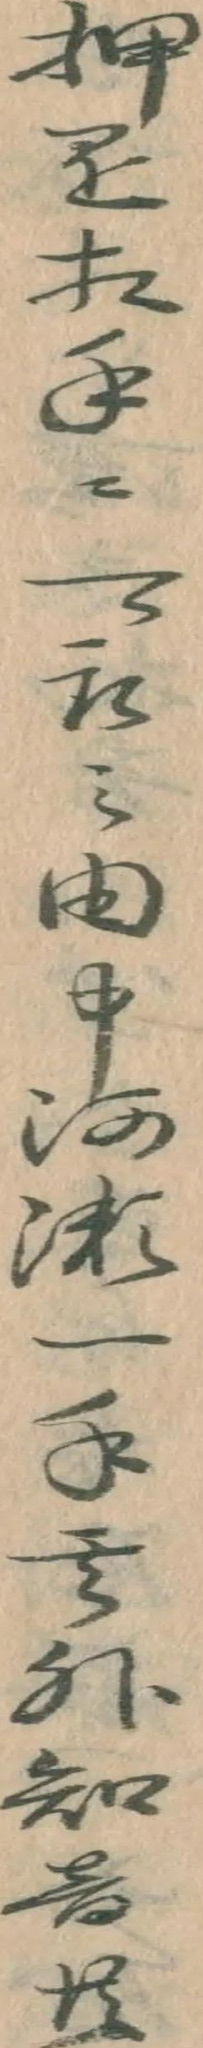押懸相手に可取之由申河瀬一手其外知音共
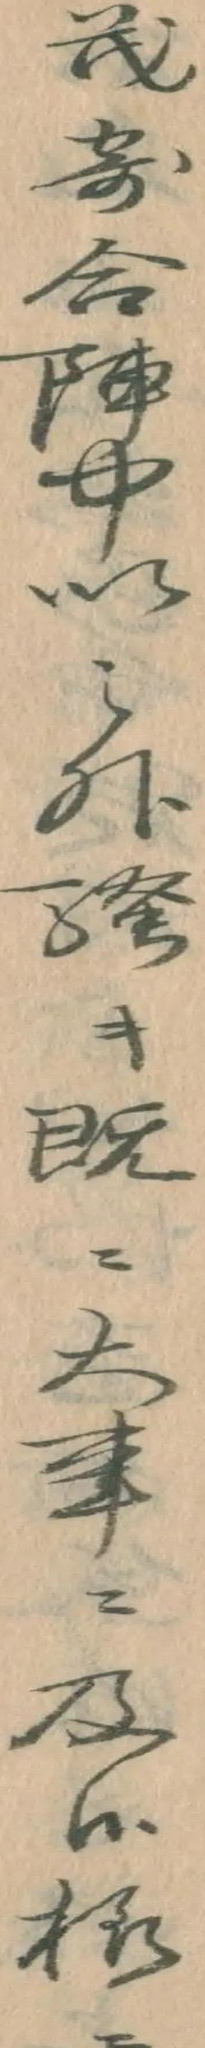茂寄合陣中以之外騒き既に大事に及候様に

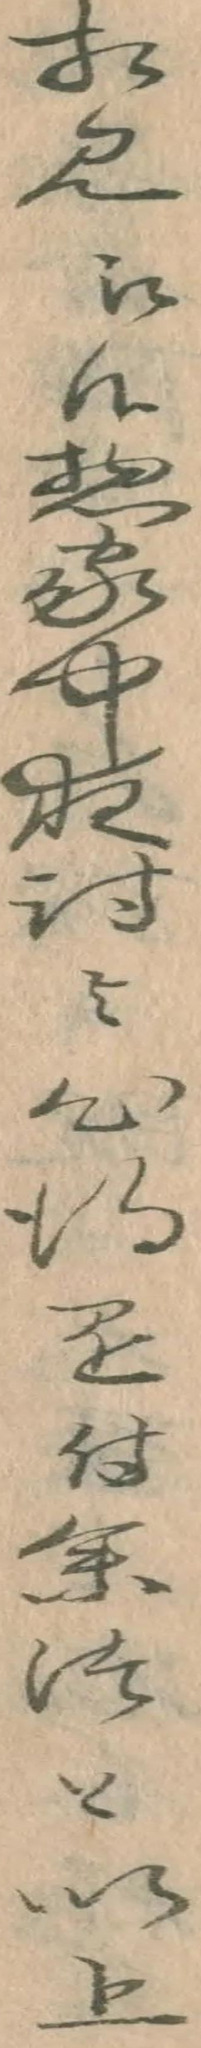相見江候惣家中夜討与心得懸付参徒と以上
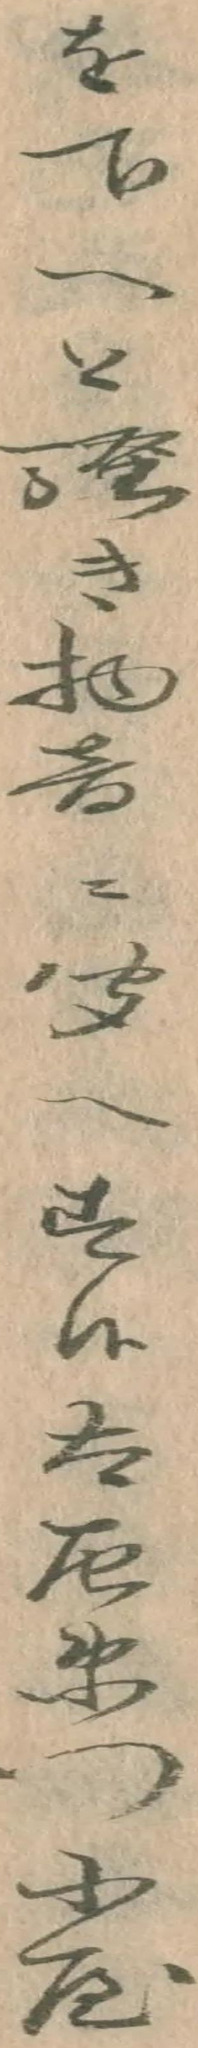を下へと騒き物音に聞へ春候太左衛門小屋
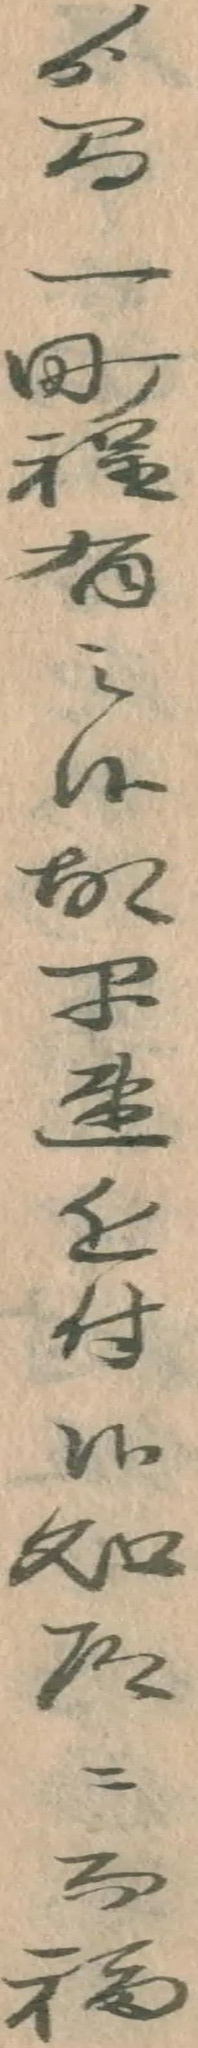ゟ間一町程有之候故早速近付候処道に而福
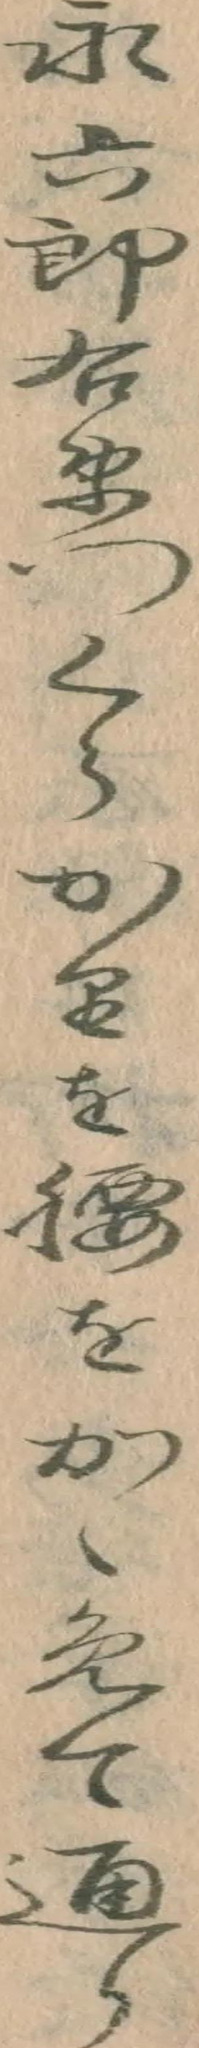永六郎右衛門くら加里を腰をかゝ免て通り
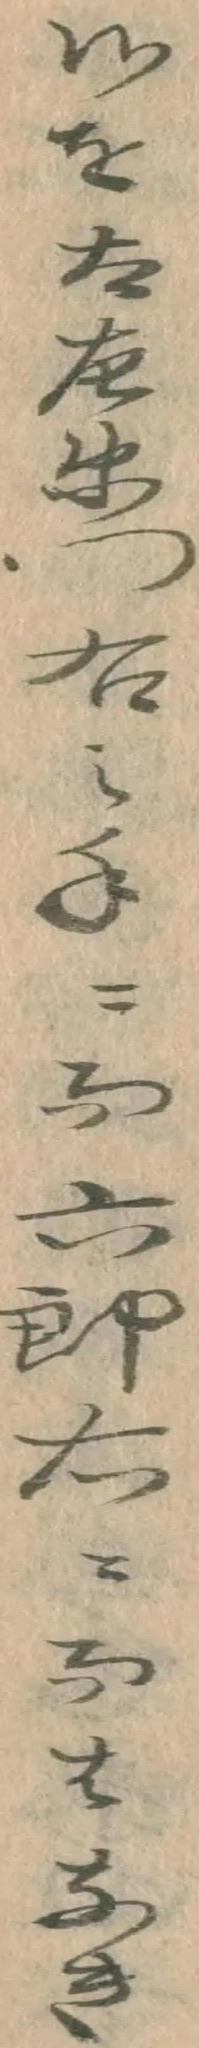候を太左衛門右之手に而六郎右に而者なき
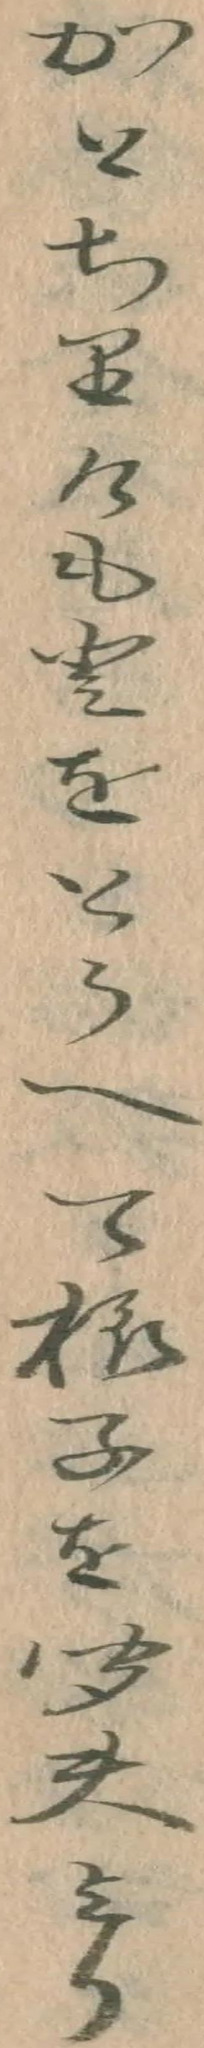かとち里けも登をとらへて様子を聞夫与り
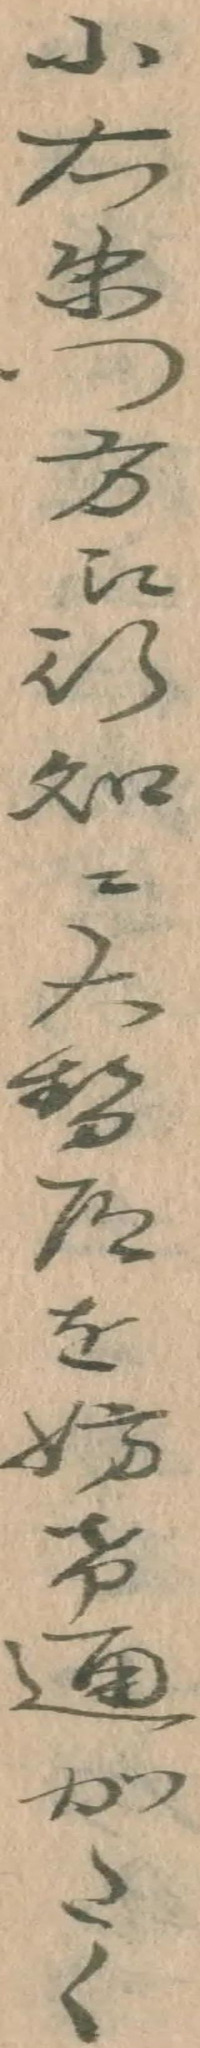小右衛門方江行処に大勢道を妨希通かたく
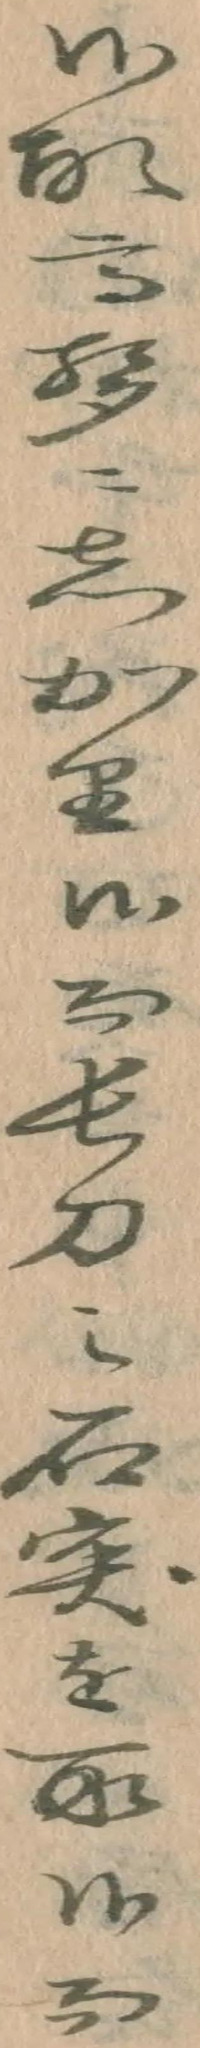候故高声に志加里候而長刀之石突を取候而
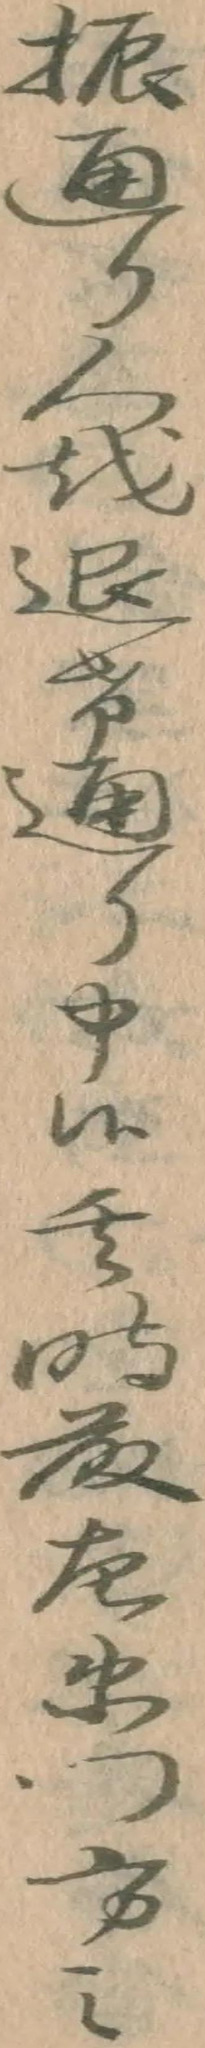振通り人越退希通り申候其時藤左衛門方之
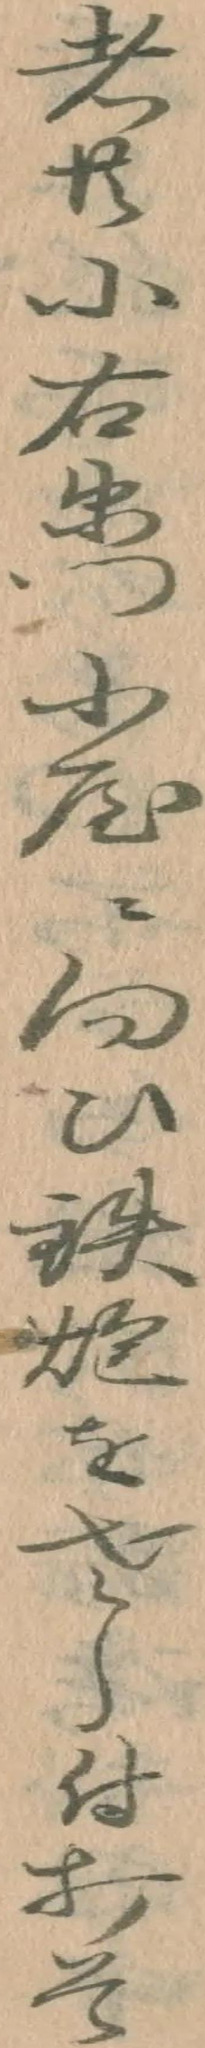者共小右衛門小屋に向ひ鉄炮をさし付打首
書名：切支丹御退治記 49巻. [4]
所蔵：国立国会図書館 National Diet Library, JAPAN
